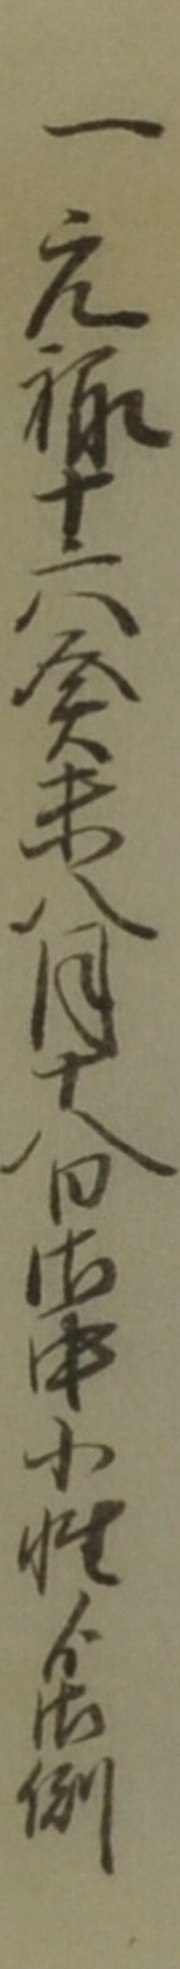一元禄十六癸未八月十八日御中小性ゟ御側
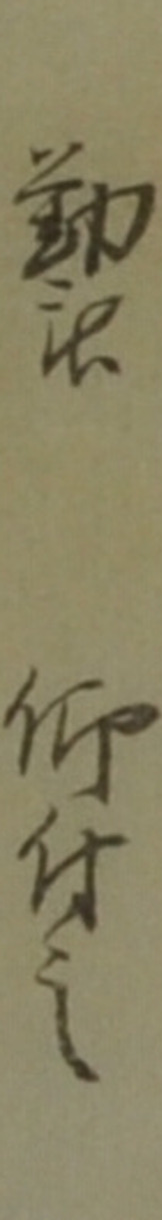勤被仰付之
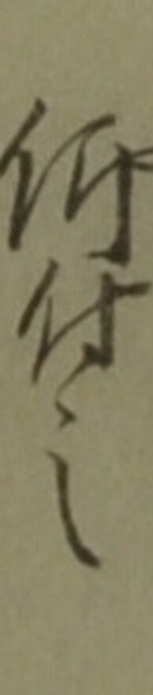仰付之
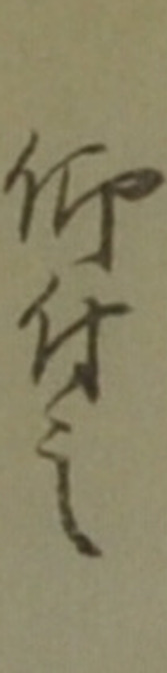仰付之
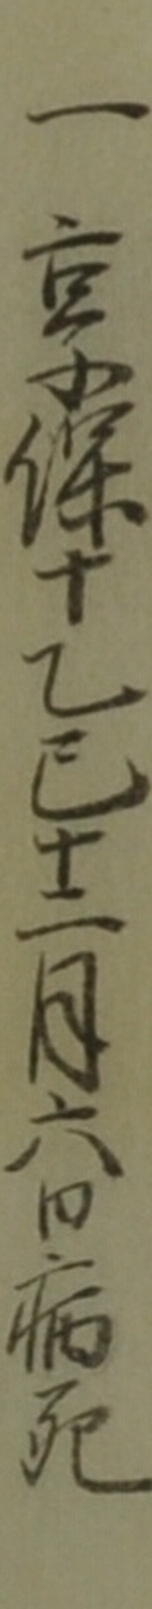一享保十乙巳十二月六日病死
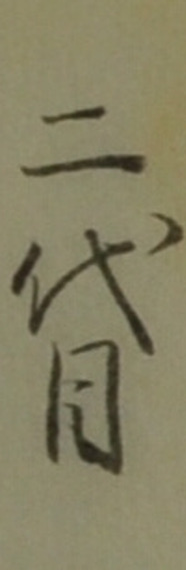二代目
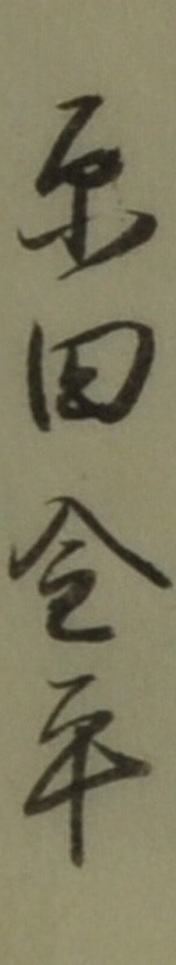原田金平
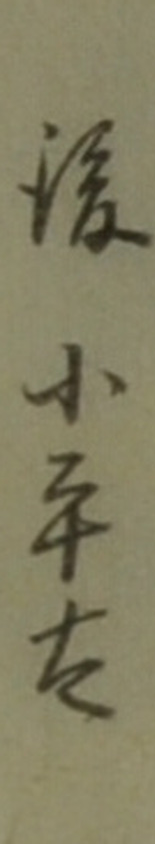後小平太
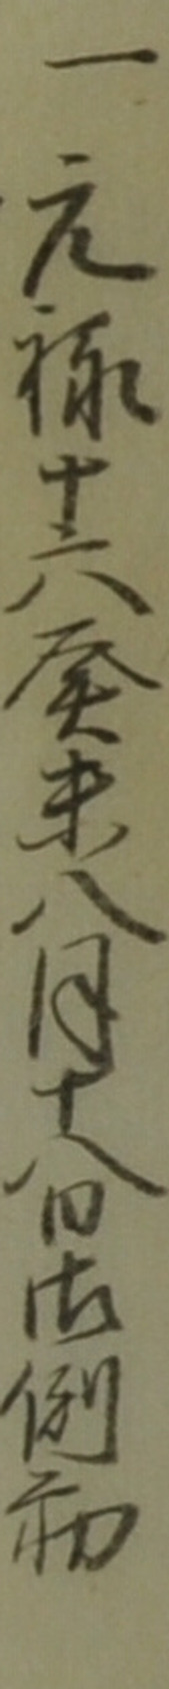一元禄十六癸未八月十八日御側勤
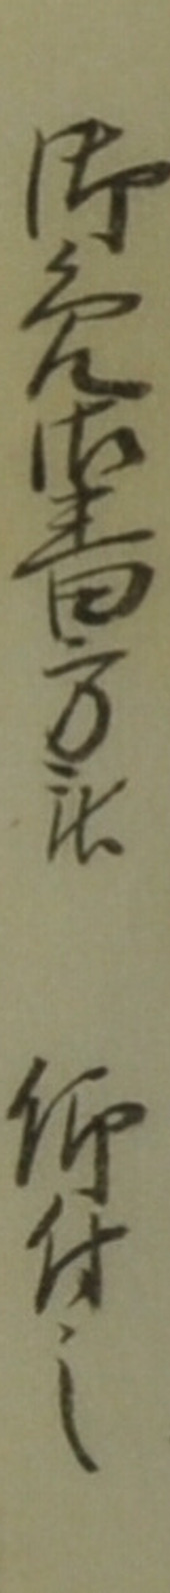御免御番方被仰付之
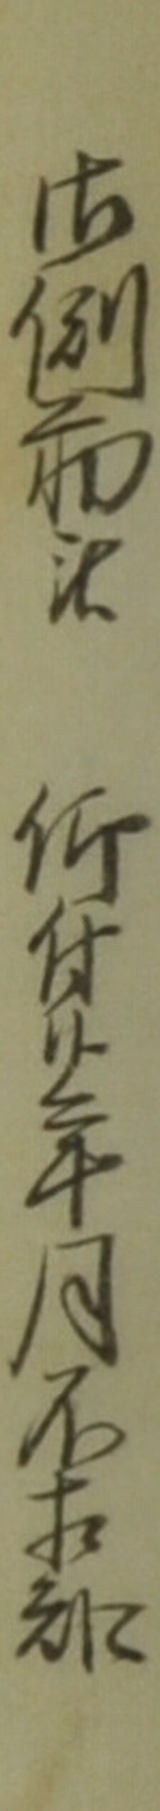御側勤被仰付候年月不相知

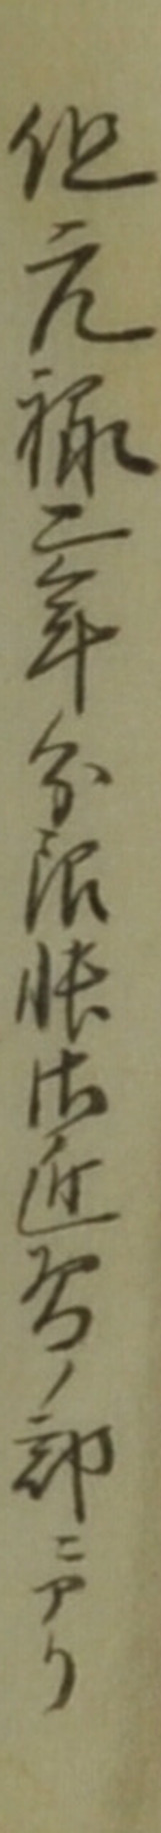但元禄二年分限帳御近習ノ部ニアリ
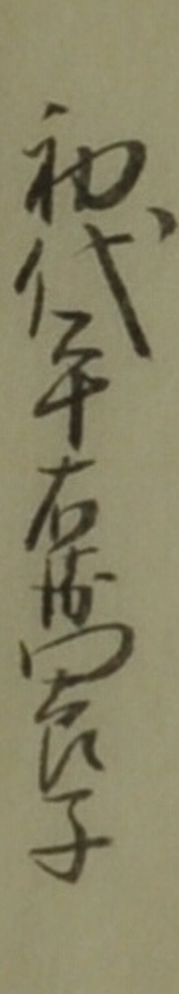初代平右衛門養子
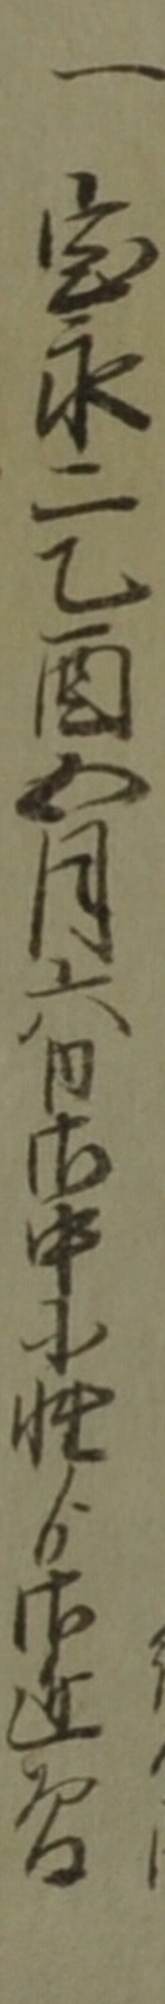一宝永二乙酉五月六日御中小性ゟ御近習
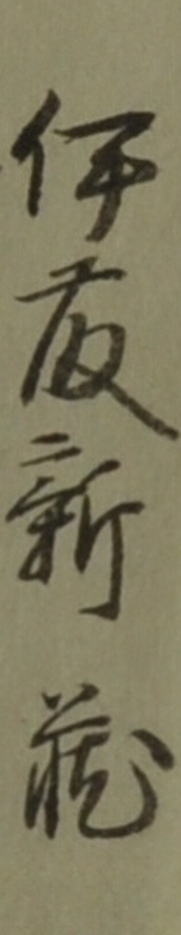伊藤新蔵
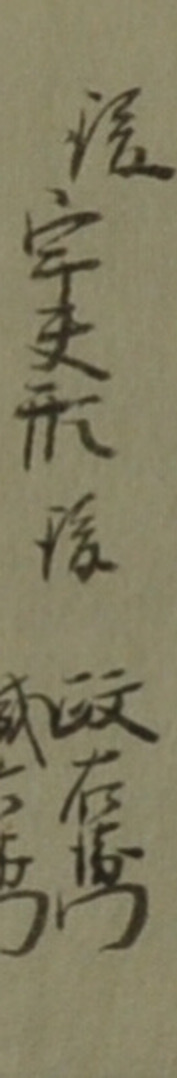後宇夫形後政右衛門
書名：諸御役代々録（五）
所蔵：伊那市立高遠町図書館・合同会社AMANE
